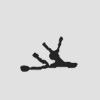出
